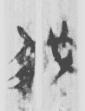我
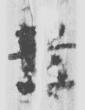是
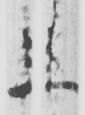之
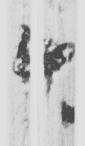㠯（以）
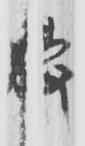皮
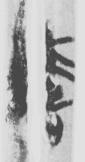差
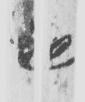臣
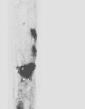之
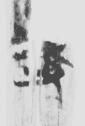尃
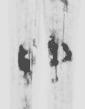心
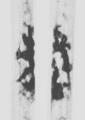𦘔
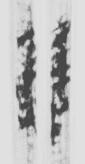{隹心}
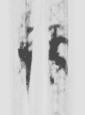不
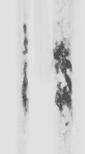敢
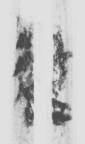{辶方}
